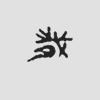歲
